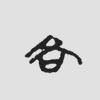各
